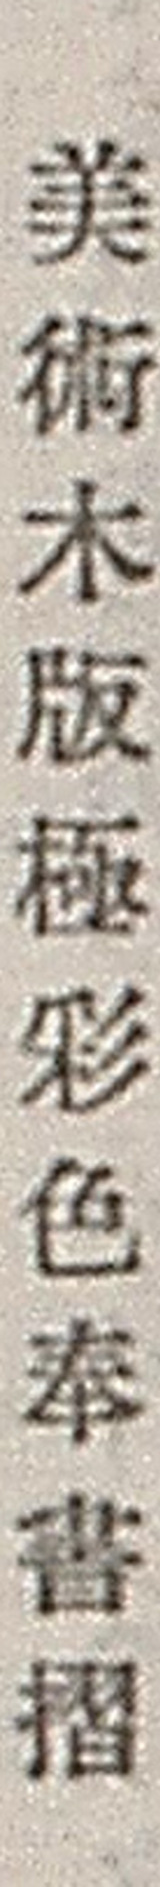美術木版極彩色奉書摺
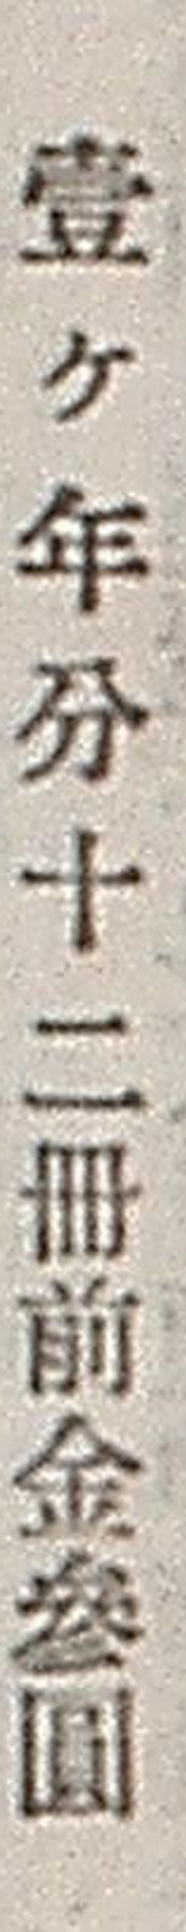壱ケ年分十二冊前金参円
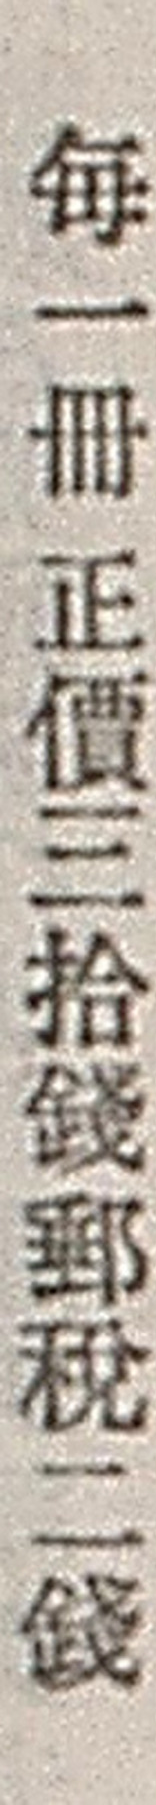毎一冊正価三拾銭郵税二銭
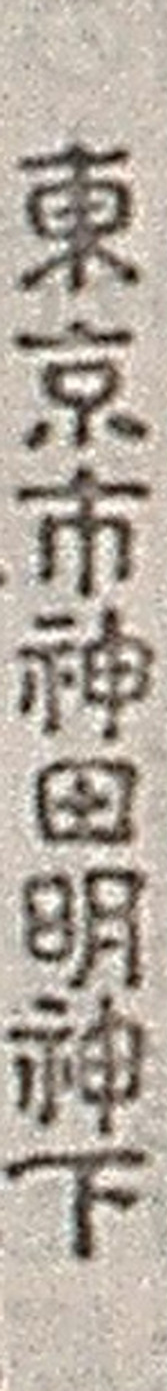東京市神田明神下
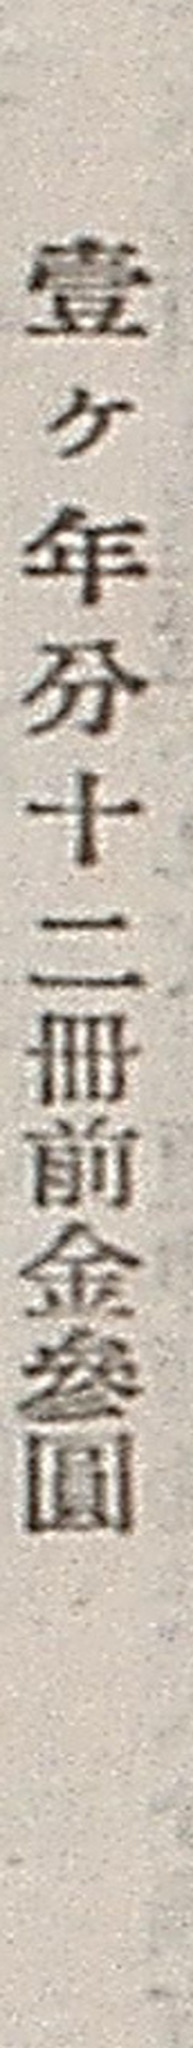壱ケ年分十二冊前金参円
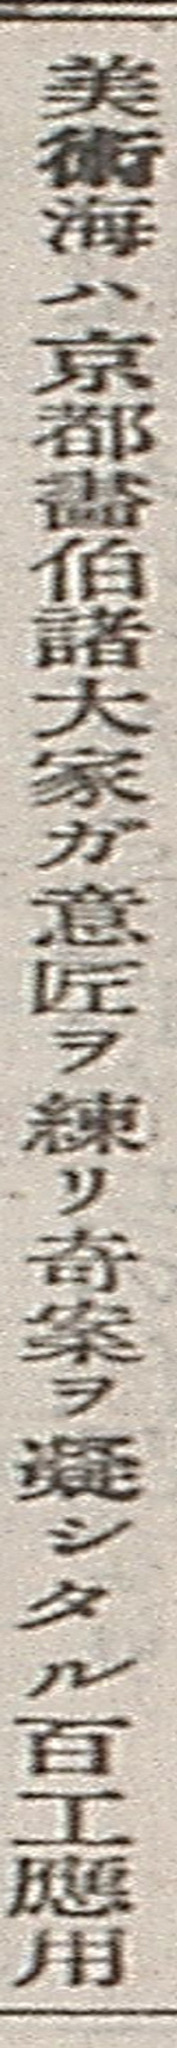美術海ハ京都画伯大家ガ意匠ヲ練リ奇案ヲ凝シタル百工応用
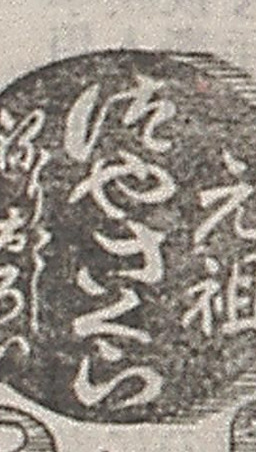つやさくら
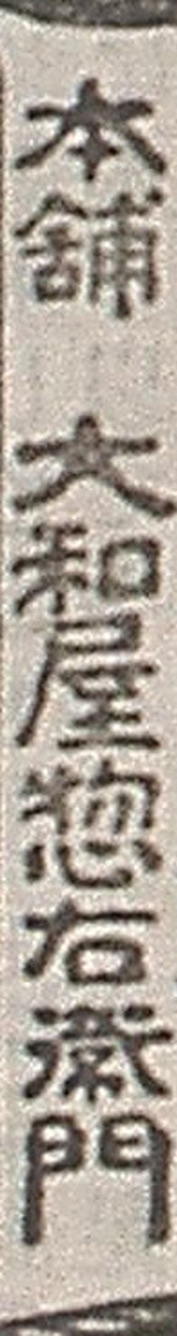本舗大和屋惣右衛門
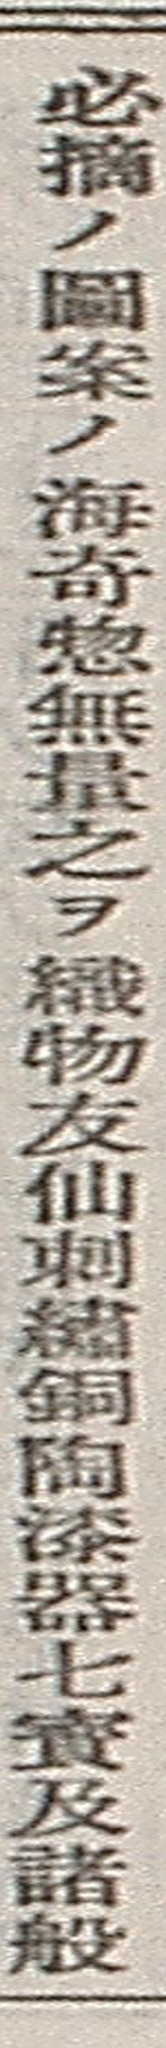必摘ノ図案ノ海奇惣無量之ヲ織物友仙刺繍銅陶漆器七宝及諸般
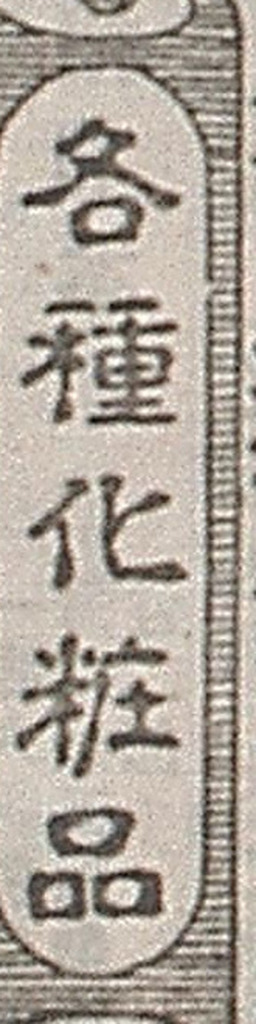各種化粧品
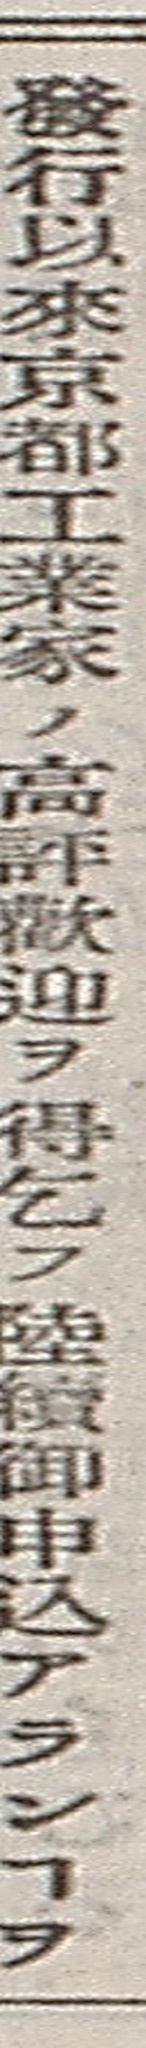発行以来京都工業家ノ高評歓迎ヲ得乞フ陸績御申込アランヿヲ
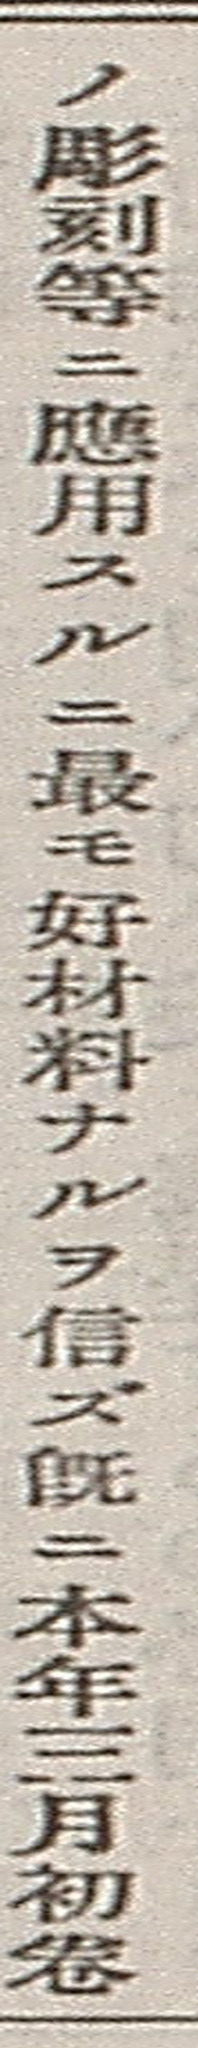ノ彫刻等ニ応用スルニ最モ好材料ナルヲ信ズ既ニ本年三月初巻
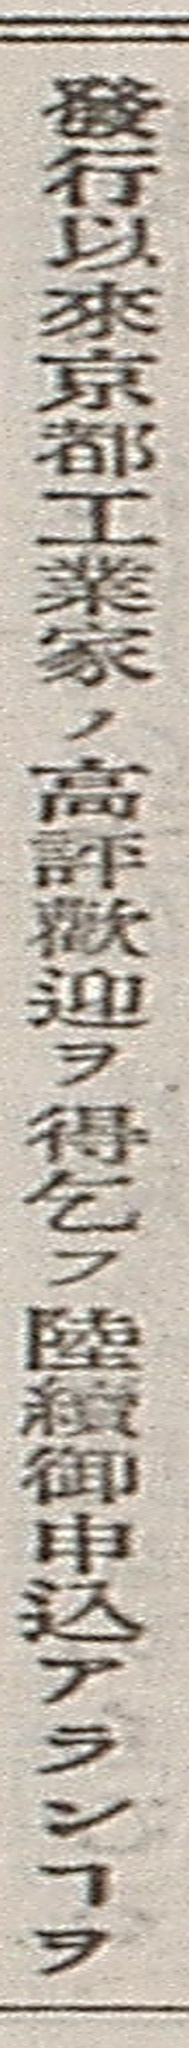発行以来京都工業家ノ高評歓迎ヲ得乞フ陸績御申込アランヿヲ
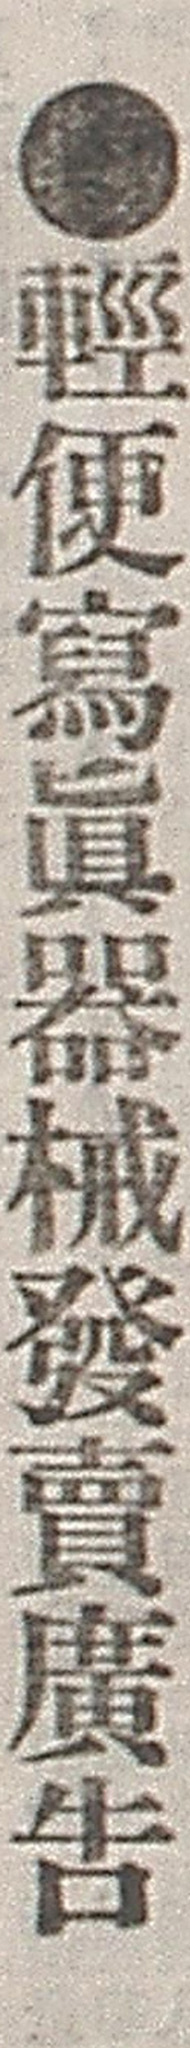●軽便写真器械発売広告
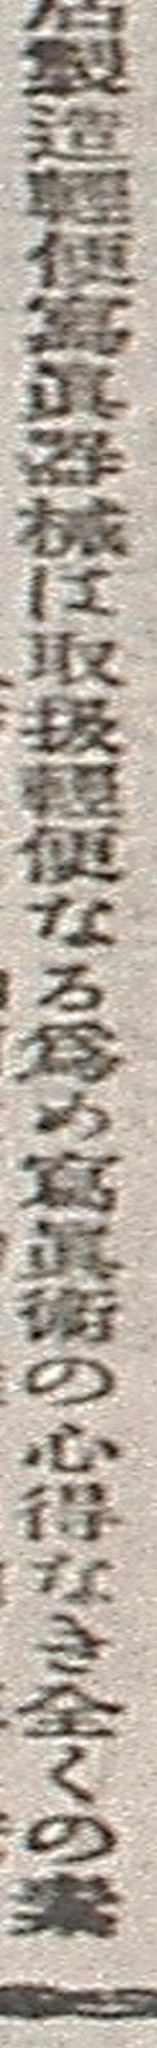弊店製造軽便写真器械は取扱軽便なる為め写真術の心得なき全くの素
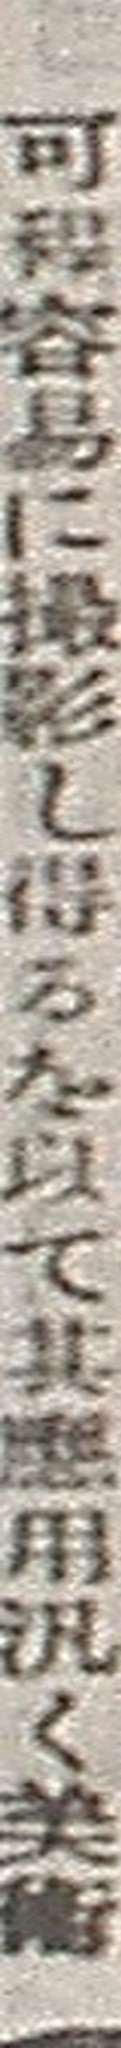可程容易に撮影し得るを以て其応用汎く美術
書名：風俗畫報臨時増刊第百十九號　大海嘯被害録（中）
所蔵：東京大学地震研究所図書室 Earthquake Research Institute Library, The University of Tokyo, JAPAN
